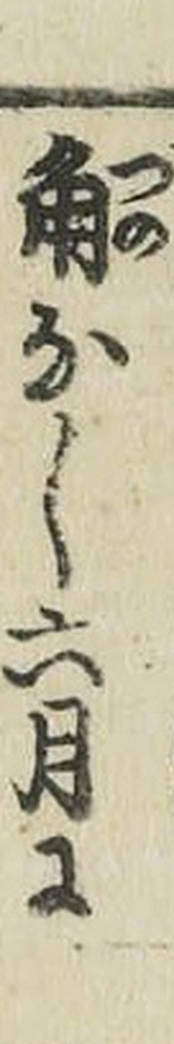角なし六月に
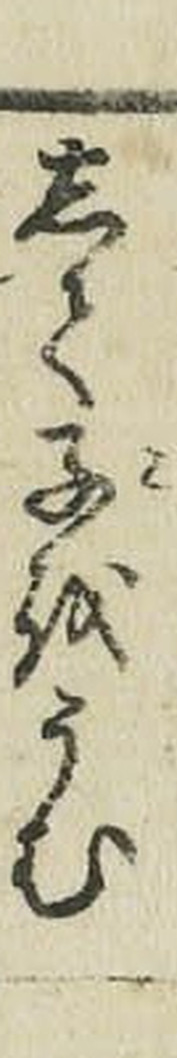して子をうむ
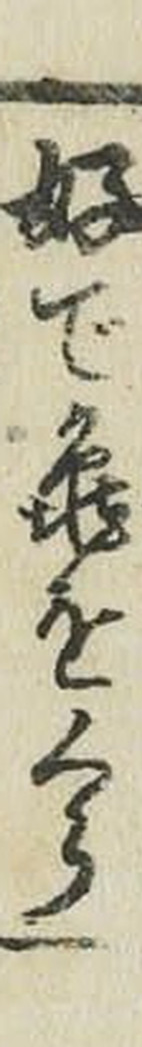好で亀をくら
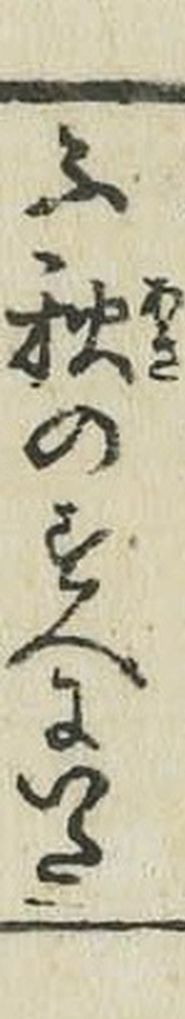ふ秋のすへにいた
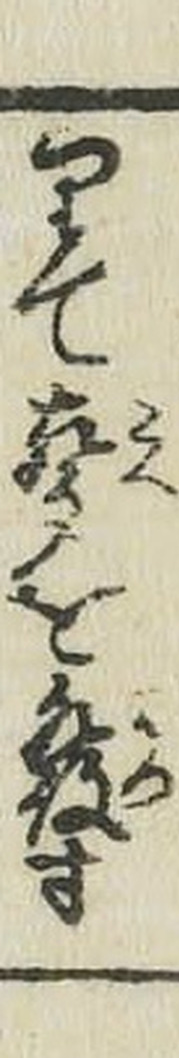りて声を発す
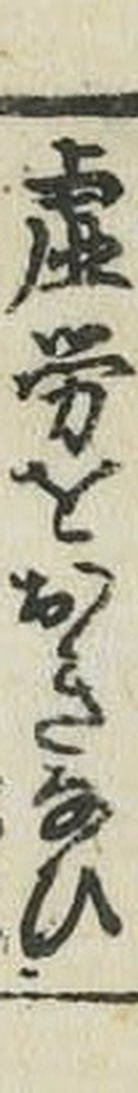虚労をおきなひ
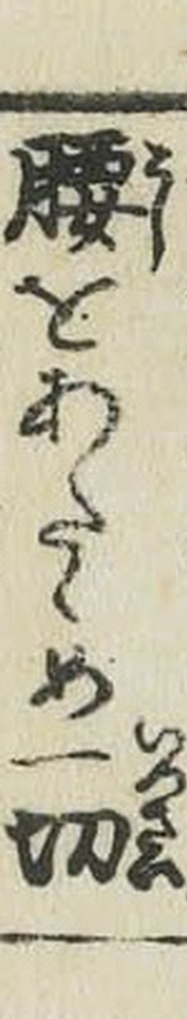腰をあたゝめ一切
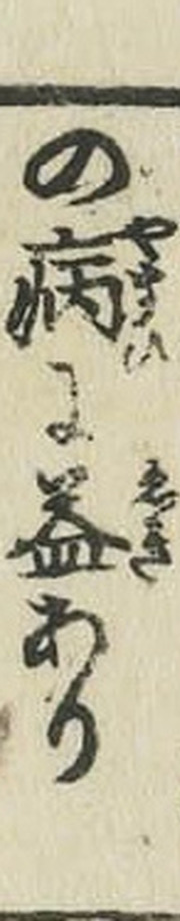の病に益あり
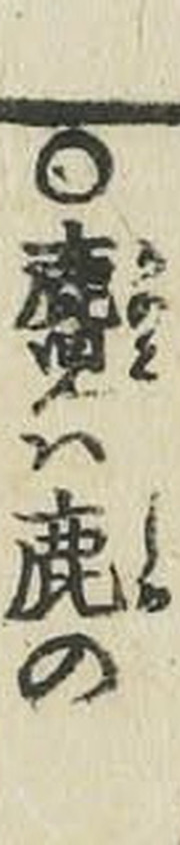○麑は鹿の
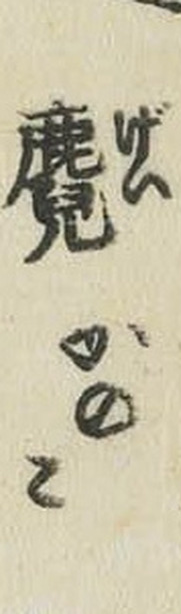かのこ
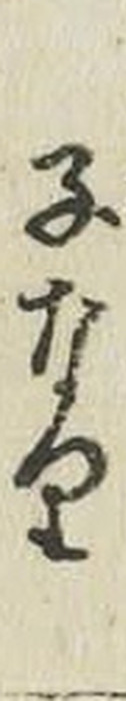子なり
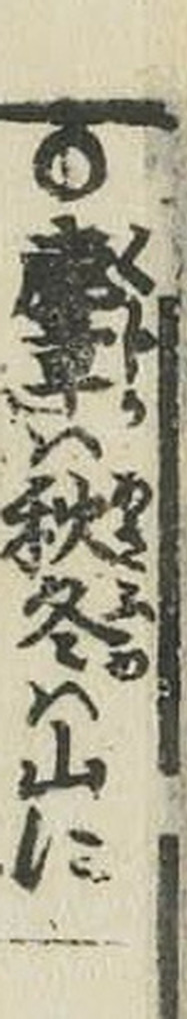○麞は秋冬は山に
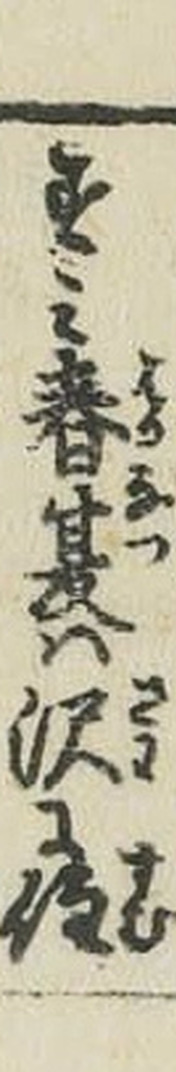すみ春夏は沢に住
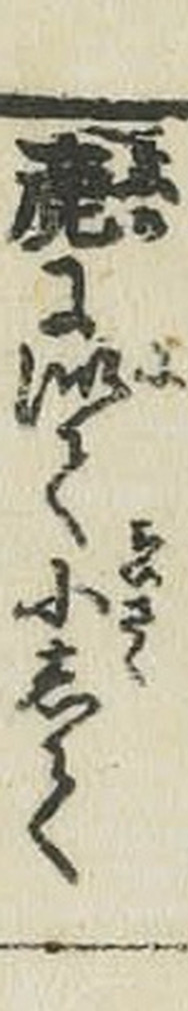鹿に似て小して
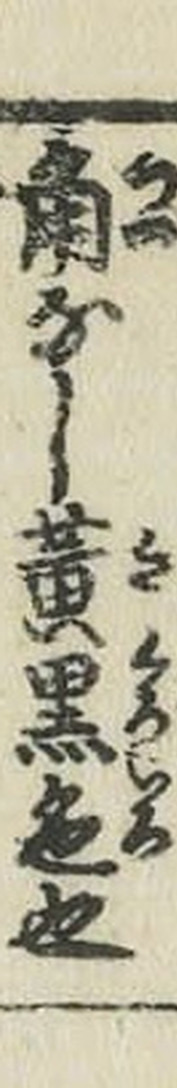角なし黄黒色也
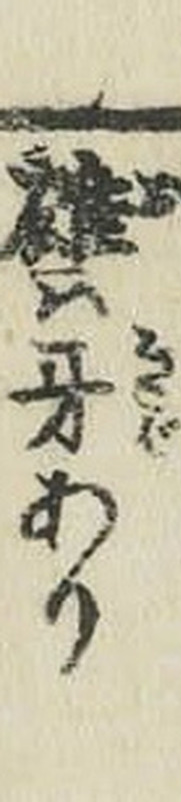雄は牙あり
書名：増補頭書訓蒙図彙大成 10巻 6:巻之12-13
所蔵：東京学芸大学教育コンテンツアーカイブ
